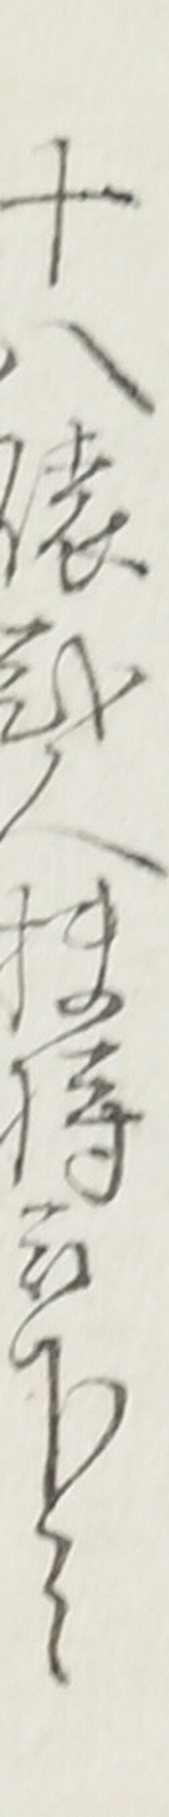十八俵弐人扶持被下之
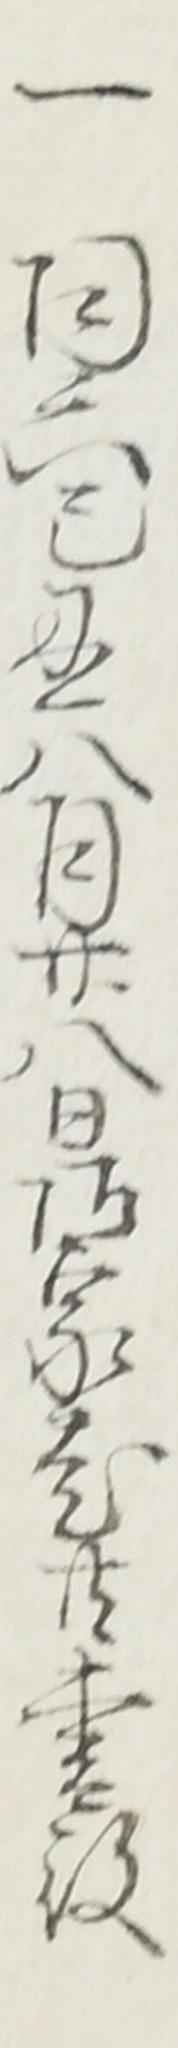一同六己丑八月廿八日御家老共書役
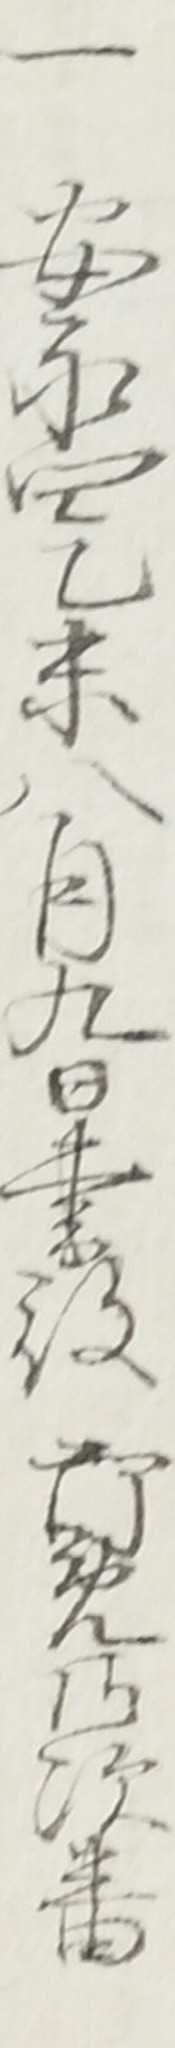一安永四乙未八月九日書役御免御次番
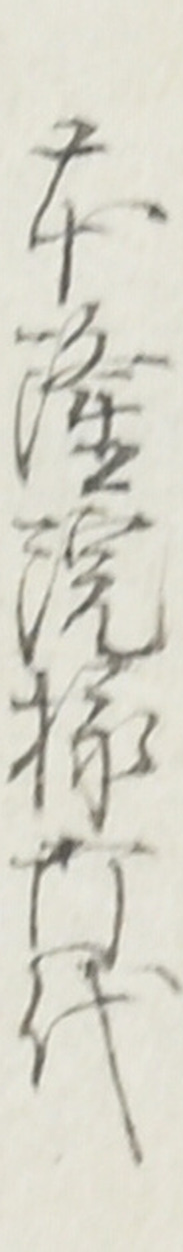本隆院様御代
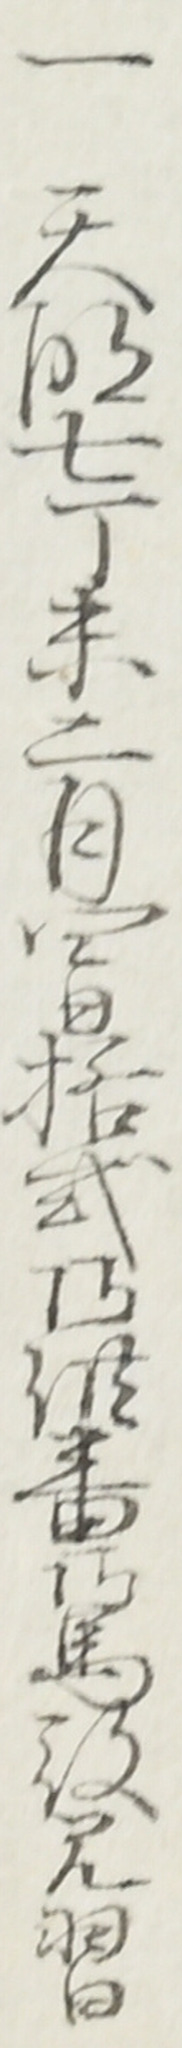一天明七丁未二月四日格式御供番御馬役見習
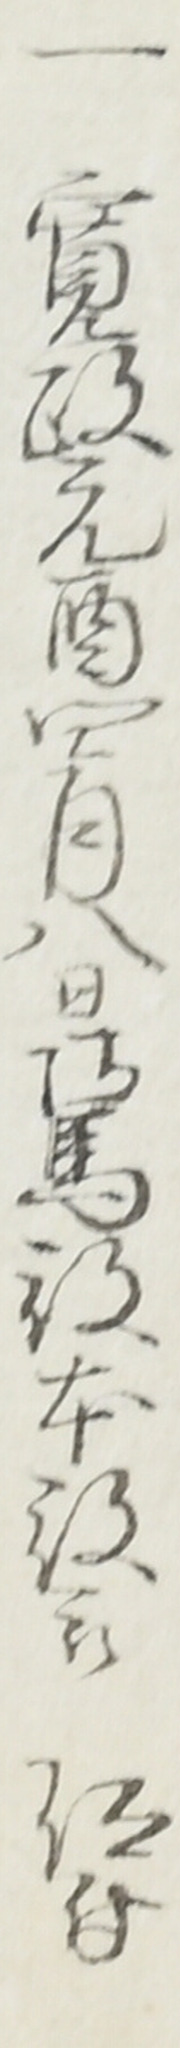一寛政元酉四月八日御馬役本役被仰付
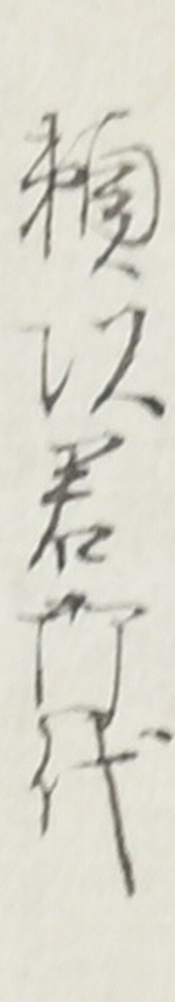頼以君御代
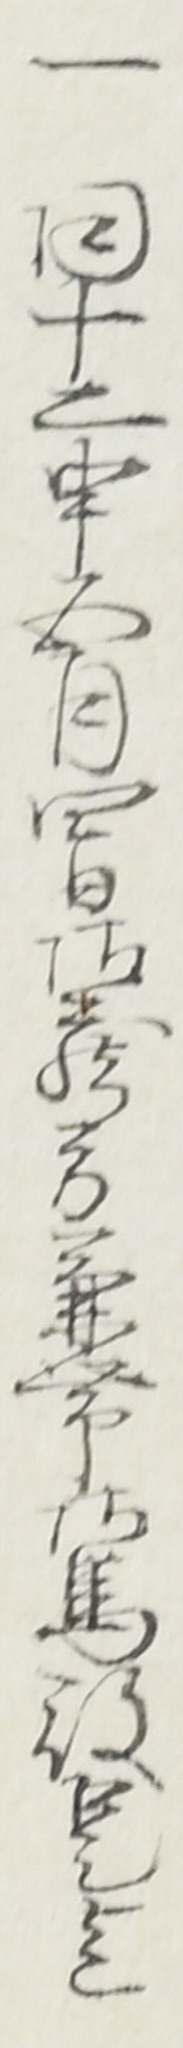一同十二申五月四日御蔵方兼帯御馬役是迄
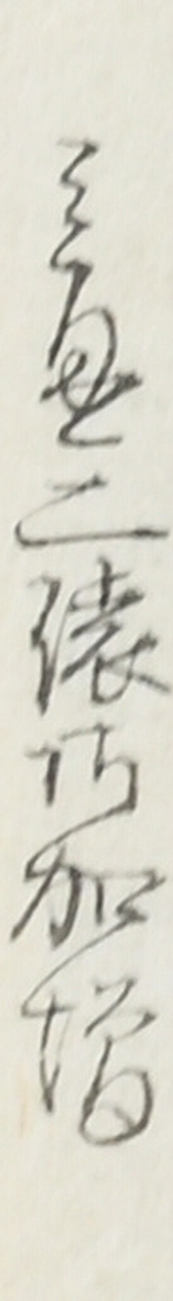之通二俵御加増

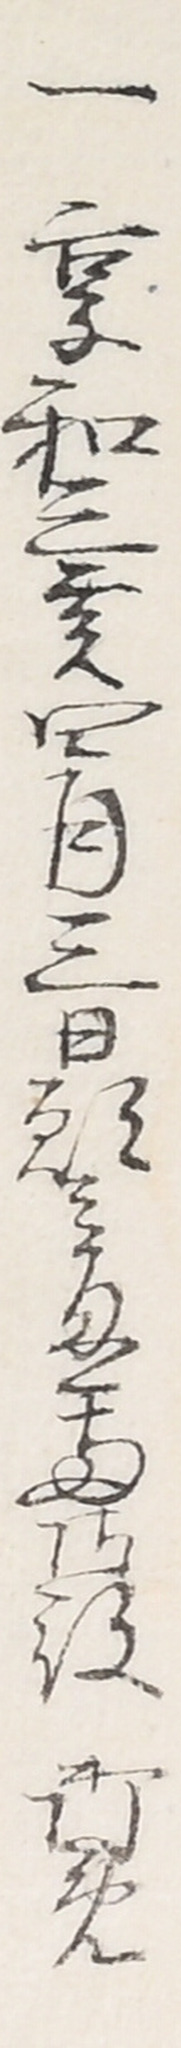一享和三亥四月三日願之通両御役御免
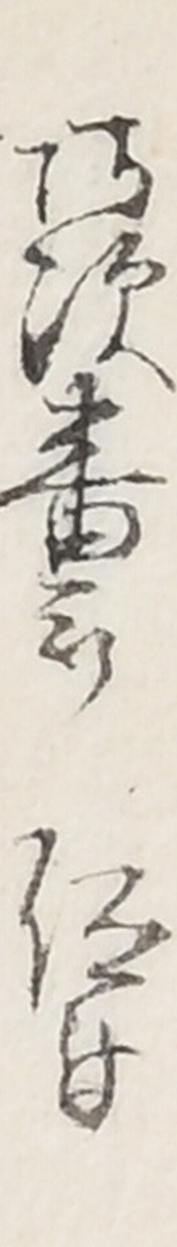御次番被仰付
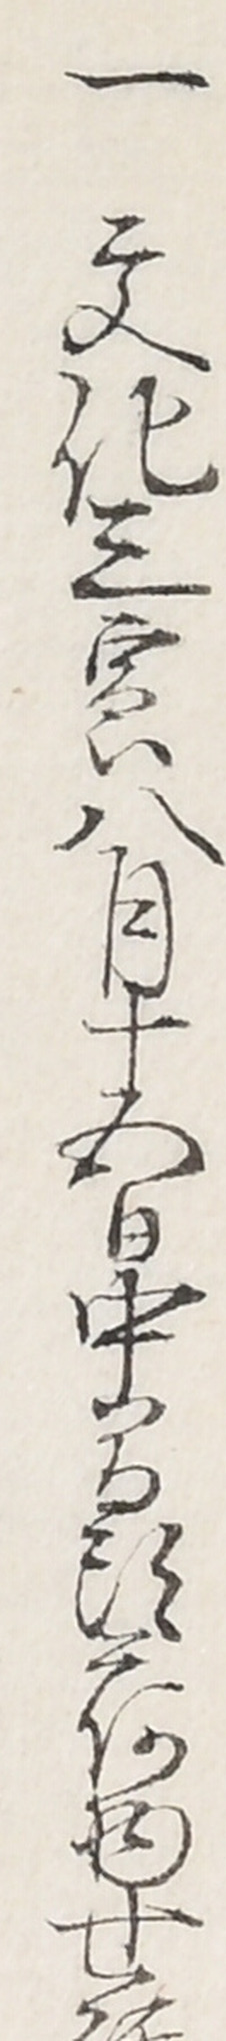一文化三寅八月十五日中間頭荷物世話役
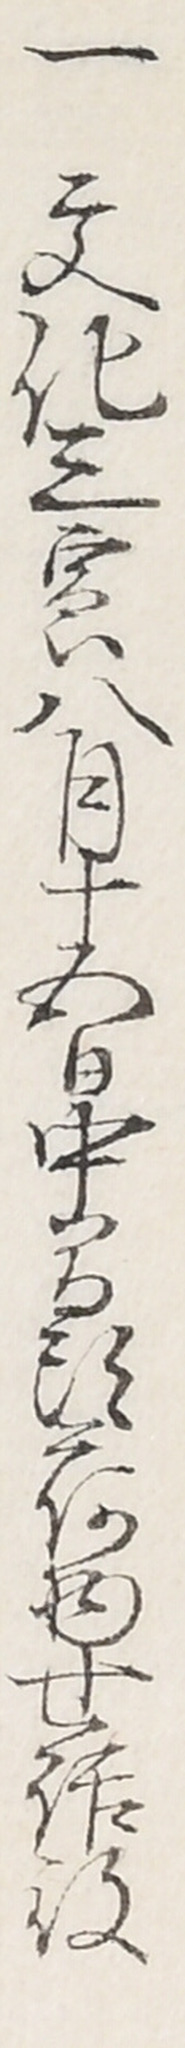一文化三寅八月十五日中間頭荷物世話役
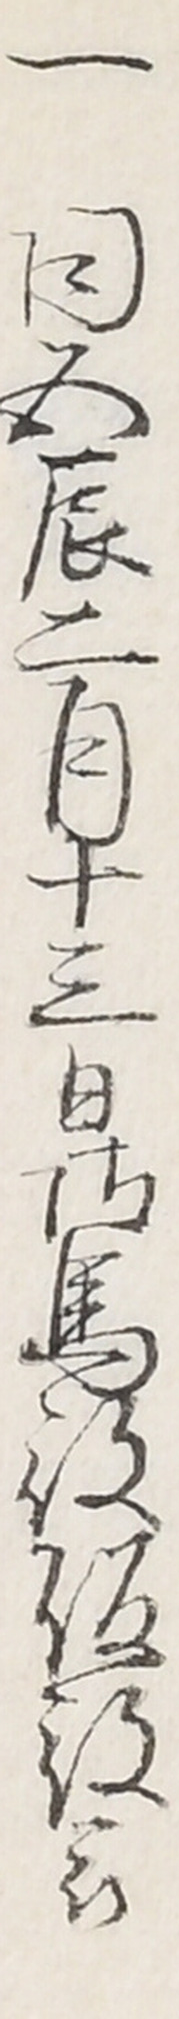一同五辰二月十三日御馬役仮役被
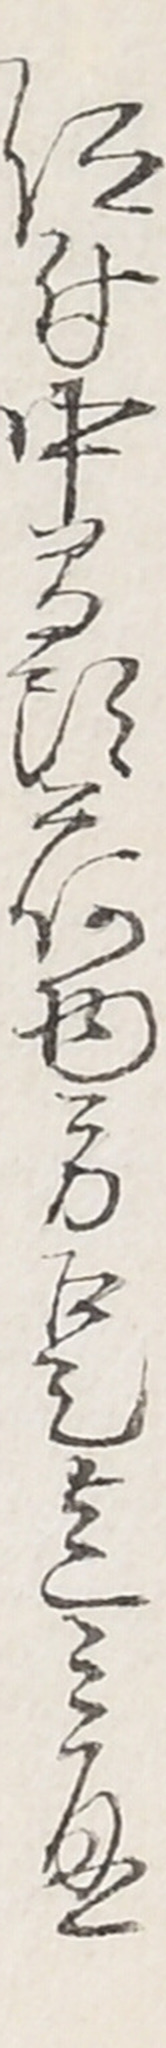仰付中間頭荷物方是迄之通
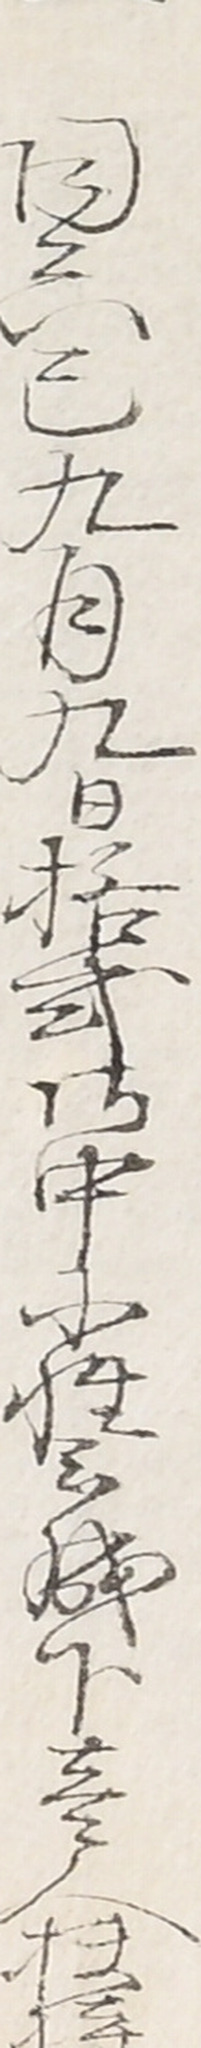一同六巳九月九日格式御中小性被成下壱人扶持
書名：無足諸士勤仕録（四）
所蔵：伊那市立高遠町図書館・合同会社AMANE
